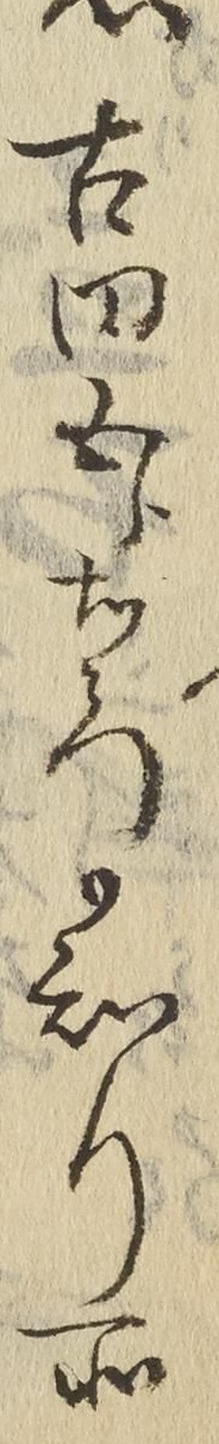古田五郎右衛門御知行所
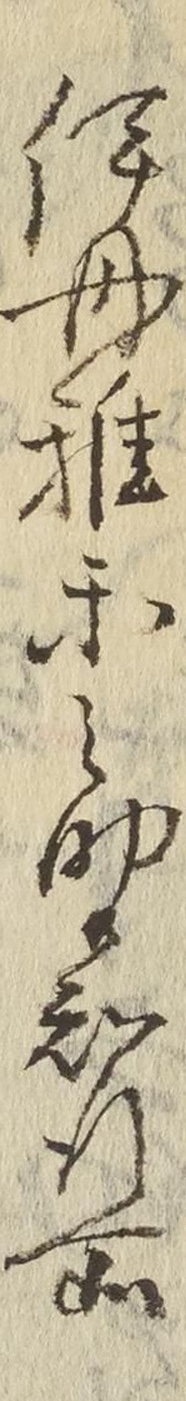伊丹雅楽之助御知行所
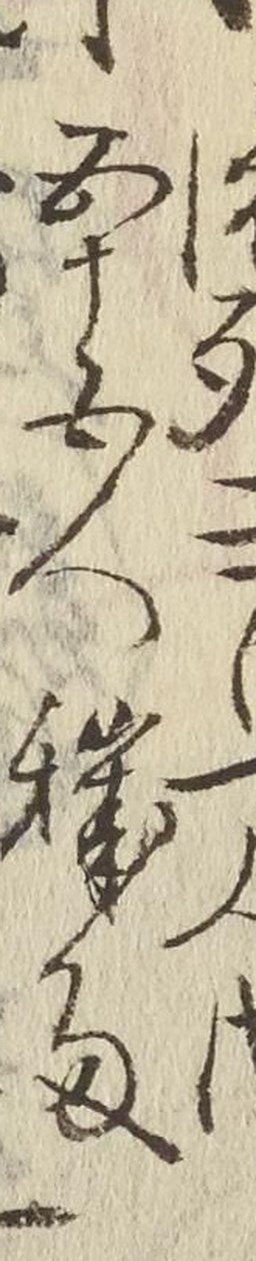五十五人穢多
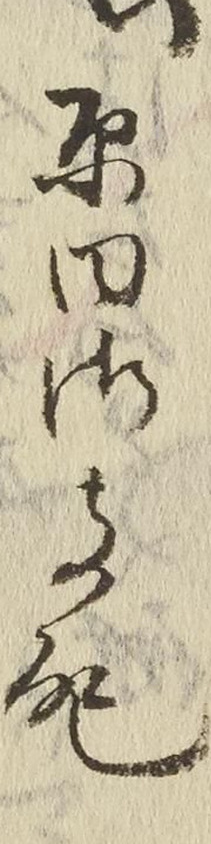原田御支配
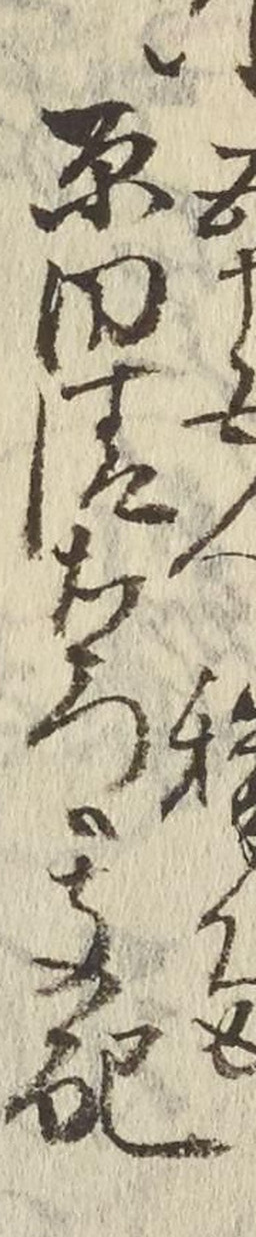原田清右衛門氏支配
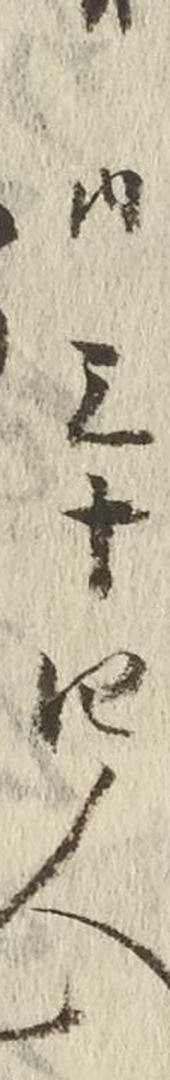内三十四人
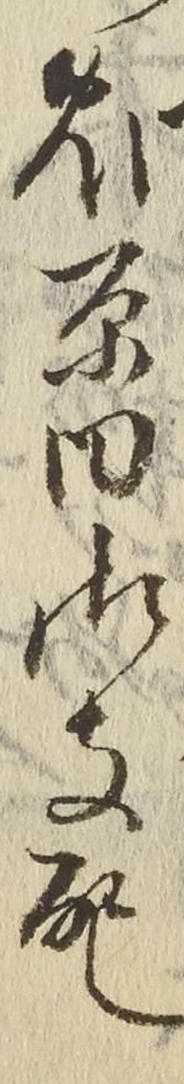原田御支配
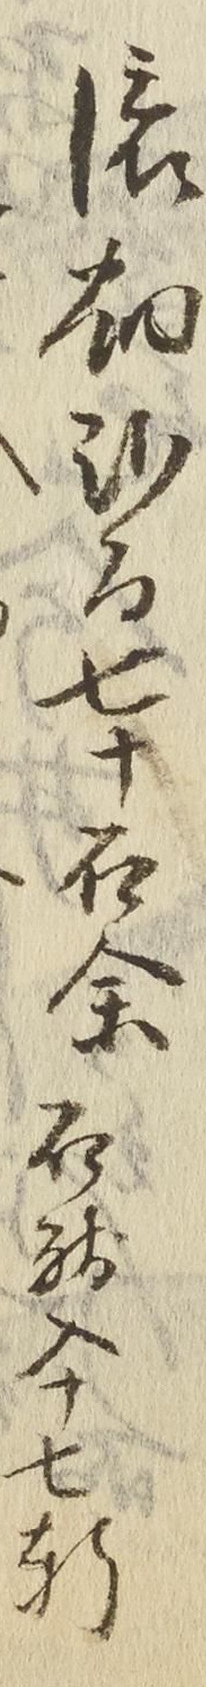三嶋流畑弐百七十石余石残入十七軒
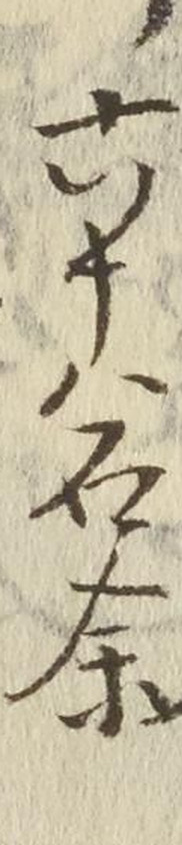六十八石余
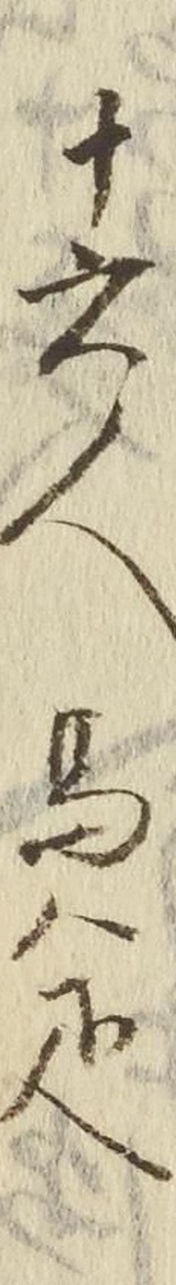十六人馬八疋
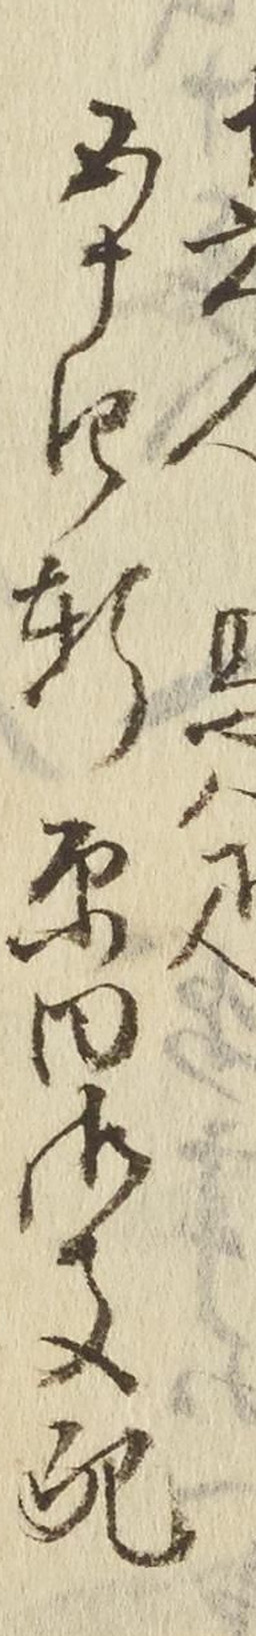五十四軒原田御支配
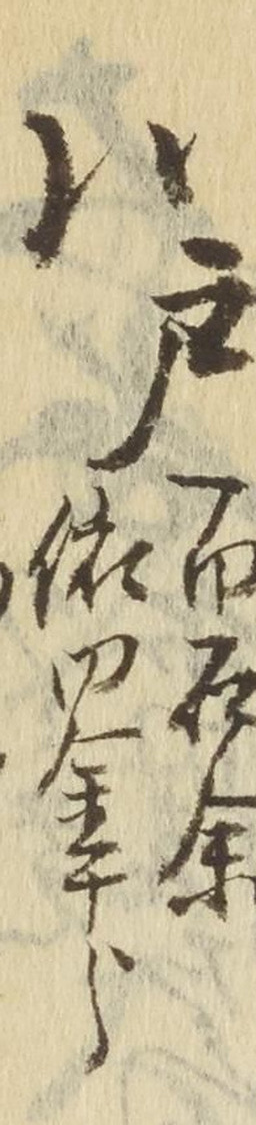依田金十郎
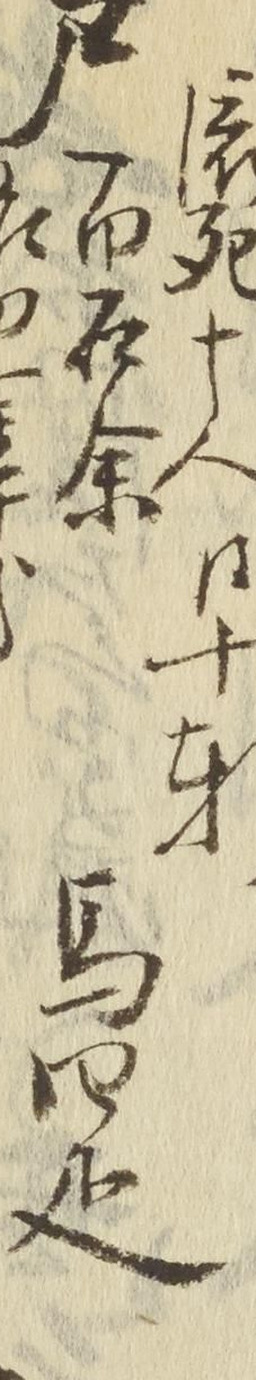百石余馬四疋
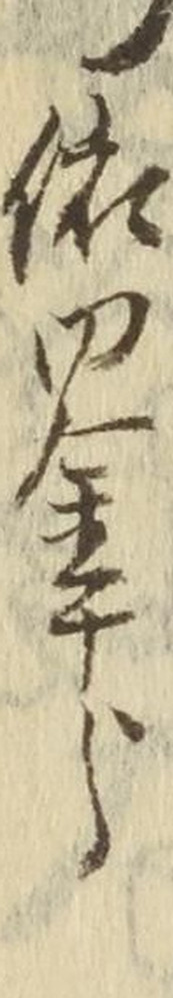依田金十郎
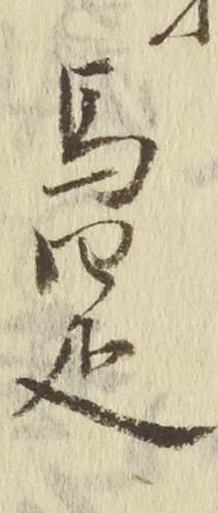馬六疋
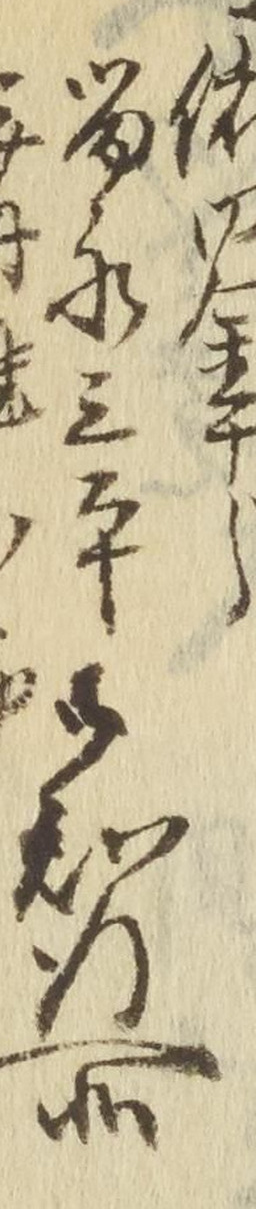冨永三平知行所
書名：浅間大變記
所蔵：東京大学地震研究所図書室 Earthquake Research Institute Library, The University of Tokyo, JAPAN
